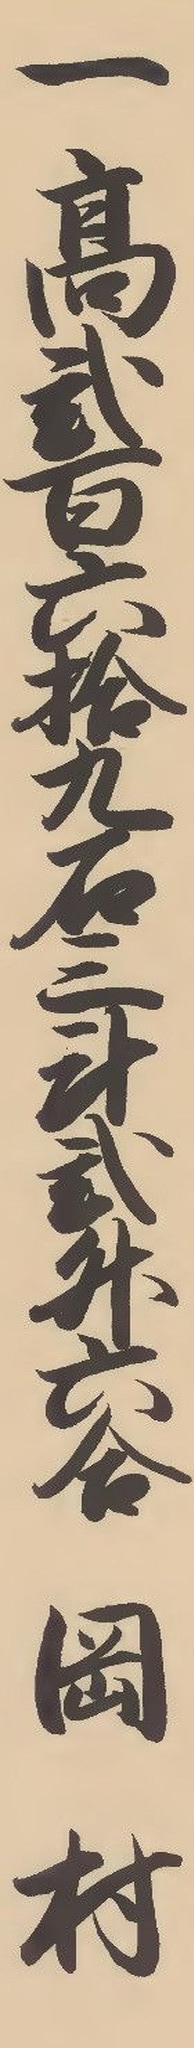一高弐百六拾九石三斗弐升六合岡村
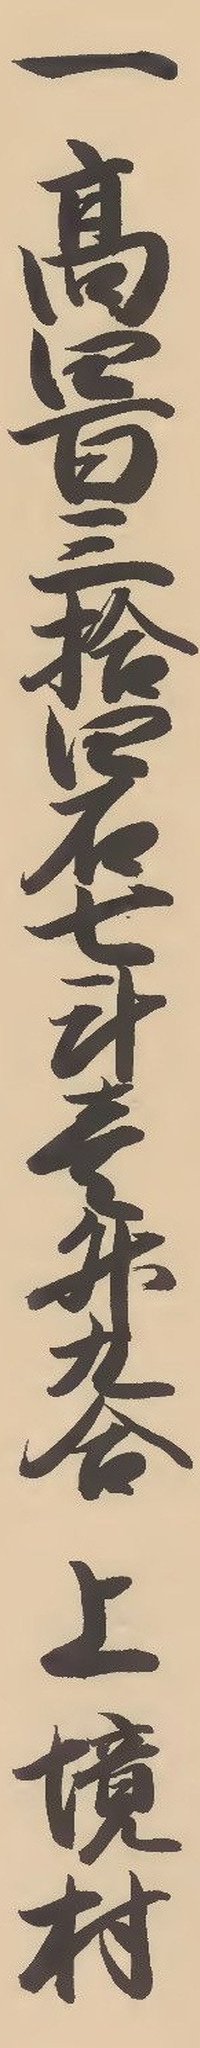一高四百三拾四石七斗壱升九合上境村
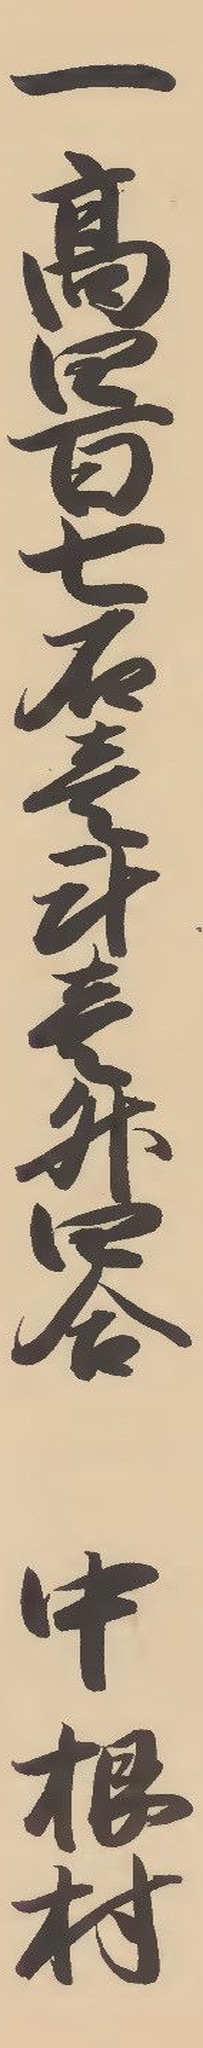一高四百七石壱斗壱升四合中根村
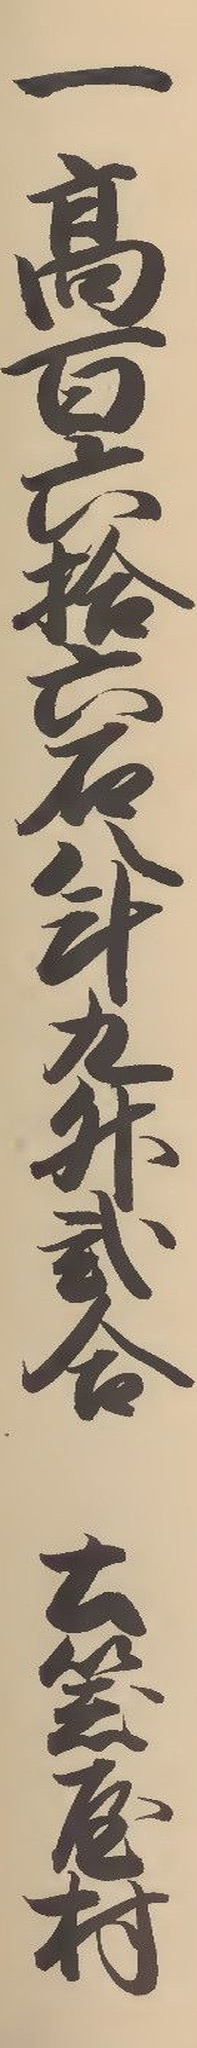一高百六拾六石八斗九升弐合土器屋村
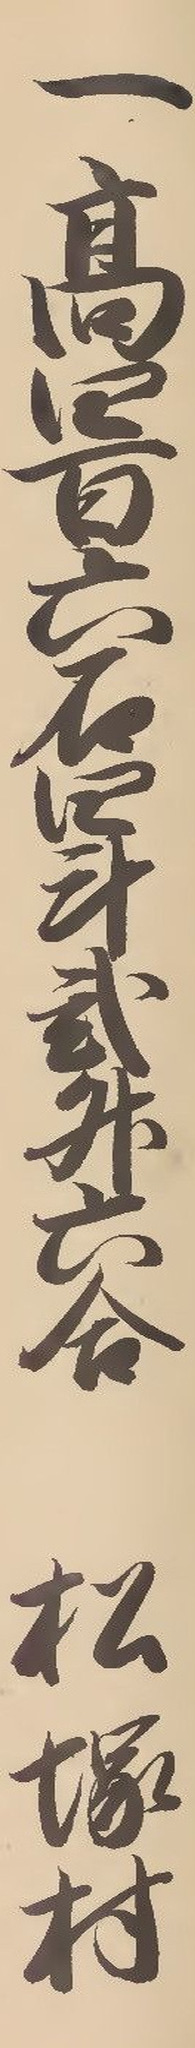一高四百六石四斗弐升六合松塚村
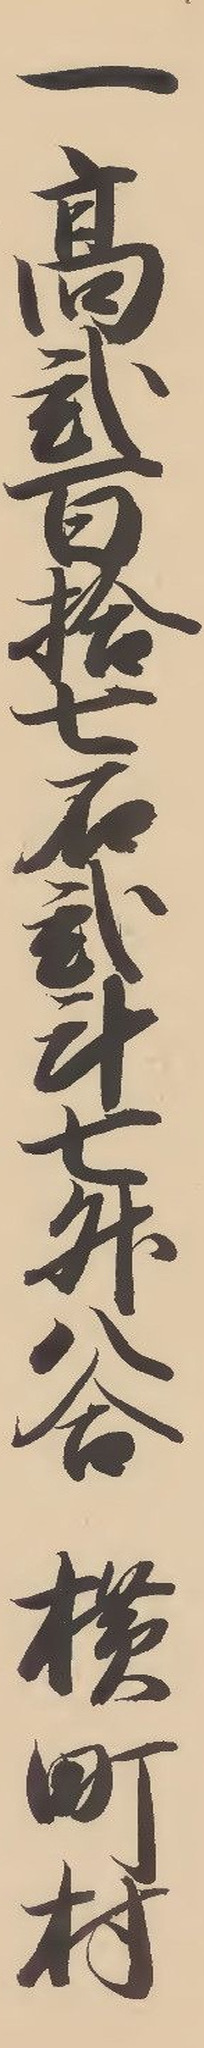一高弐百拾七石弐斗七升八合横町村
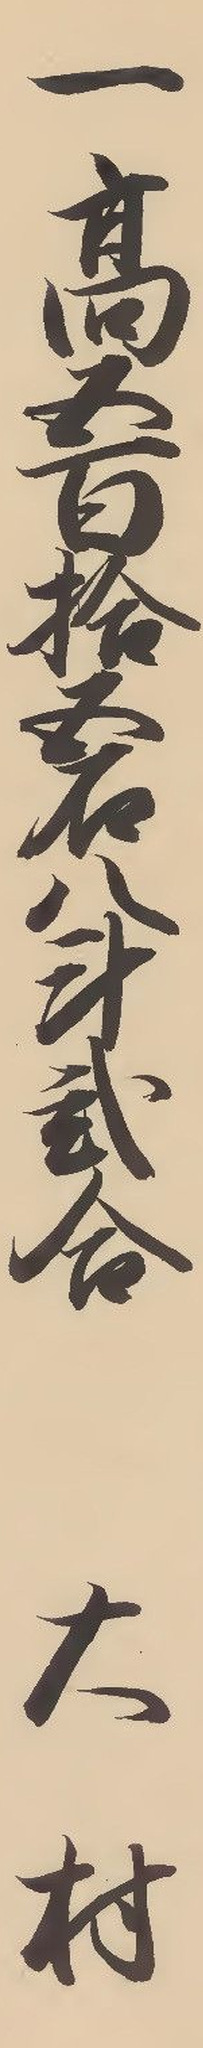一高五百拾五石八斗弐合大村
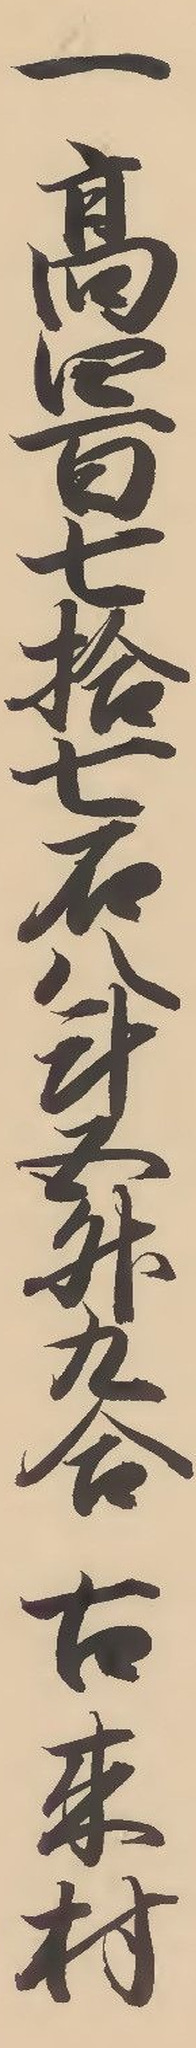一高四百七拾七石八斗五升九合古来村

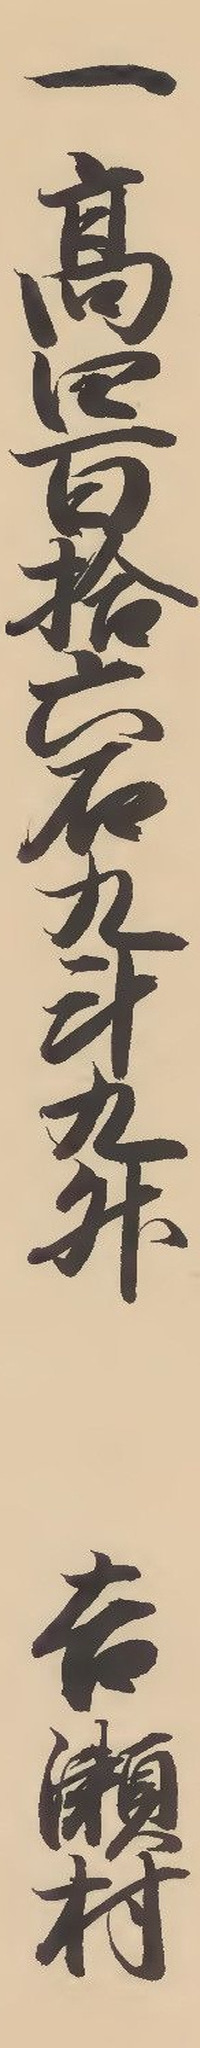一高四百拾六石九斗九升吉瀬村
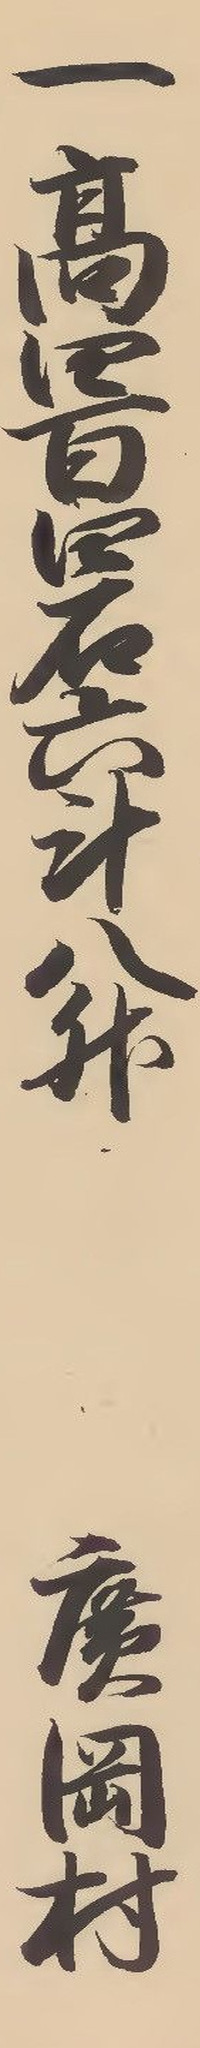一高四百四石六斗八升広岡村
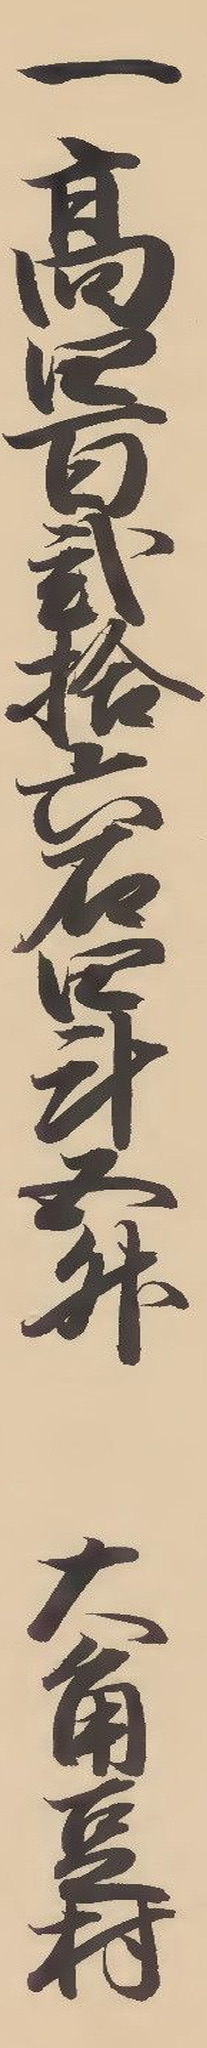一高四百弐拾六石四斗五升大角豆村
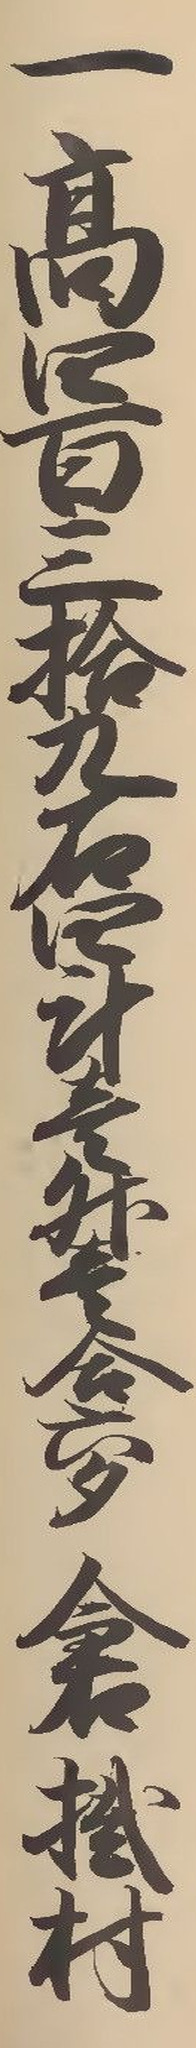一高四百三拾九石四斗壱升壱合六勺倉掛村
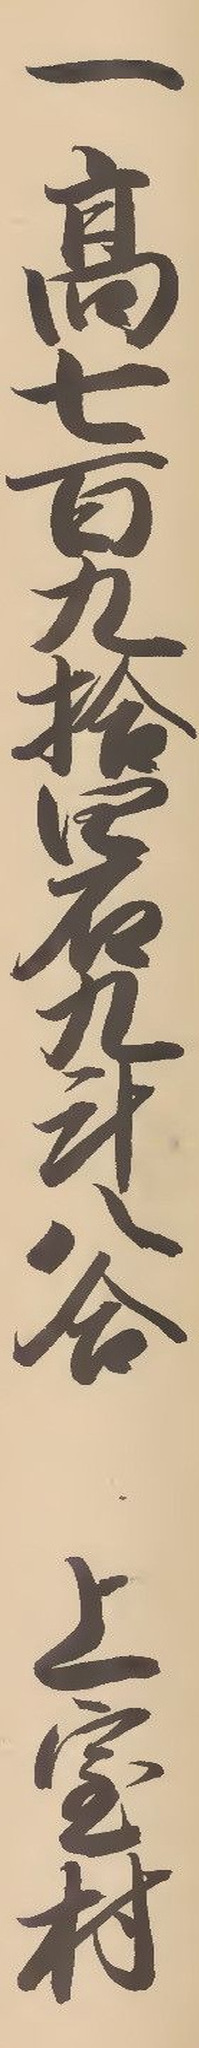一高七百九拾四石九斗八合上室村
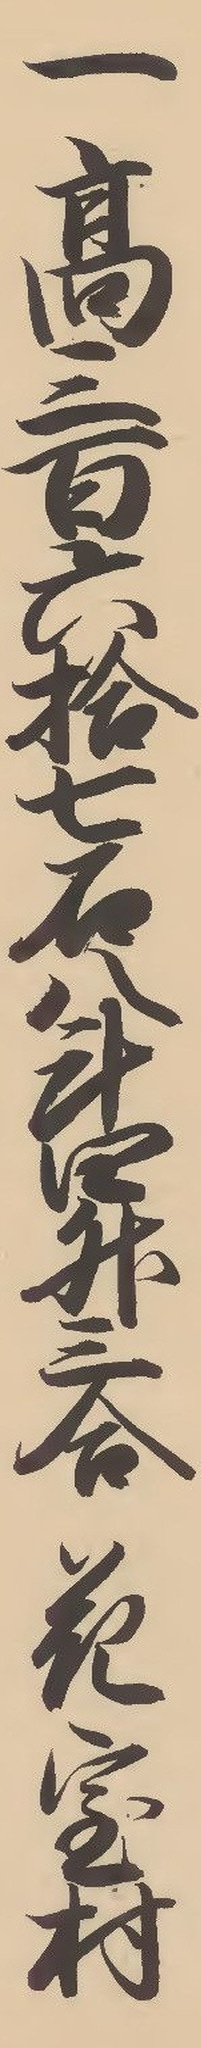一高三百六拾七石八斗四升三合花室村
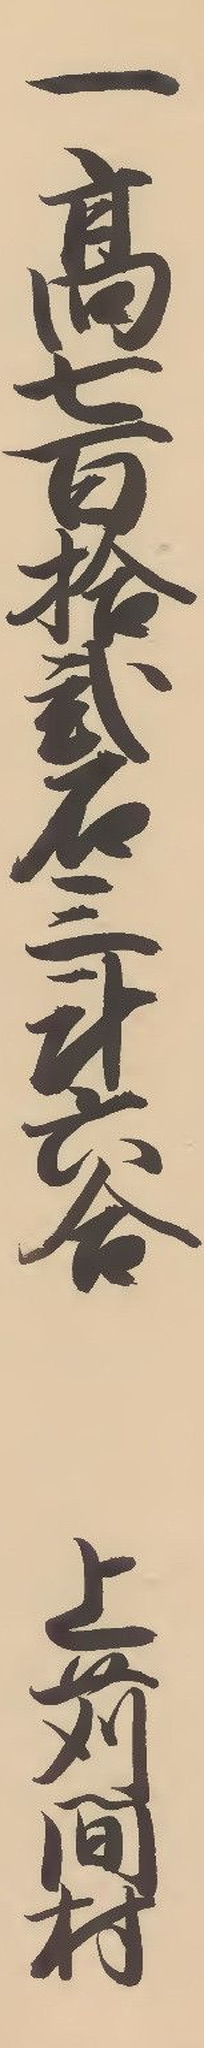一高七百拾弐石三斗六合上苅間村
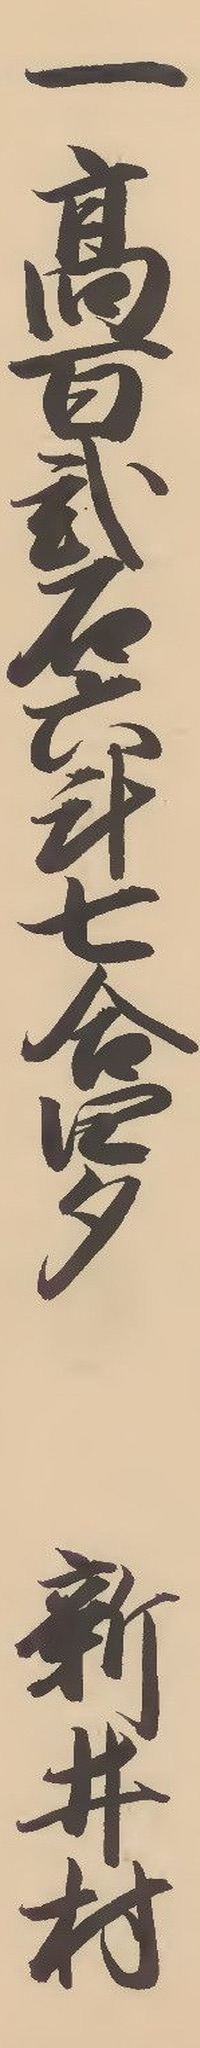一高百弐石六斗七合四勺新井村
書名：常陸国郷帳
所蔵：国立公文書館 National Archives of Japan
